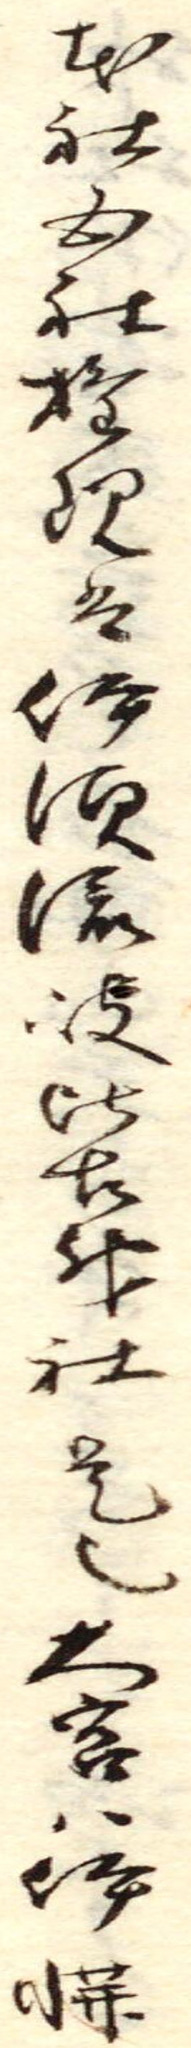本社五社権現は伊須流岐比古神社是也大宮は伊弉
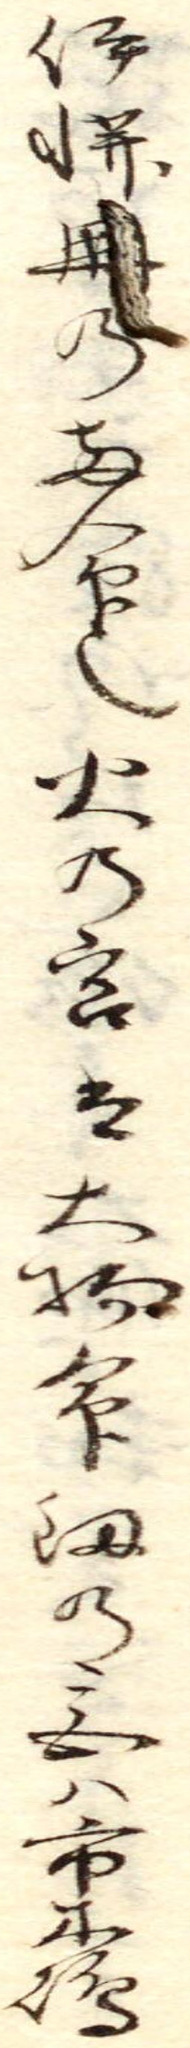伊弉冉の両命也火の宮は大物命釼の宮は市木嶋
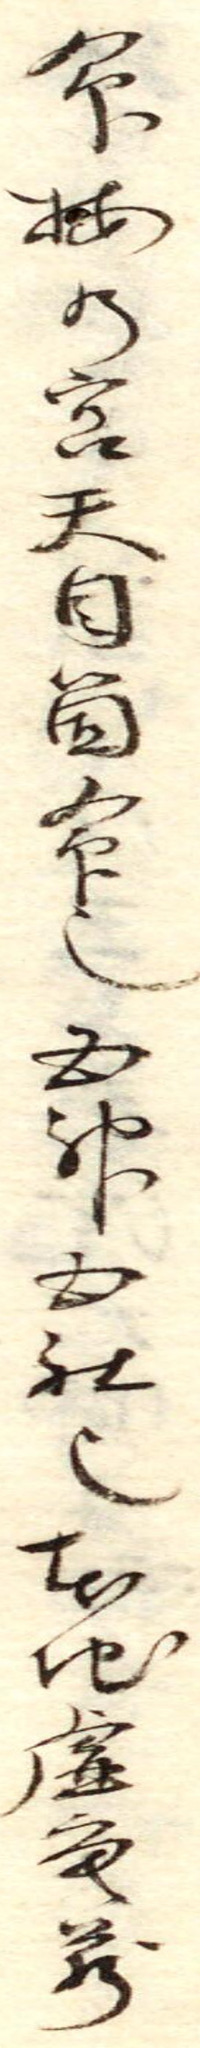命梅の宮天目箇命也五神五社也ほ本地虚空蔵
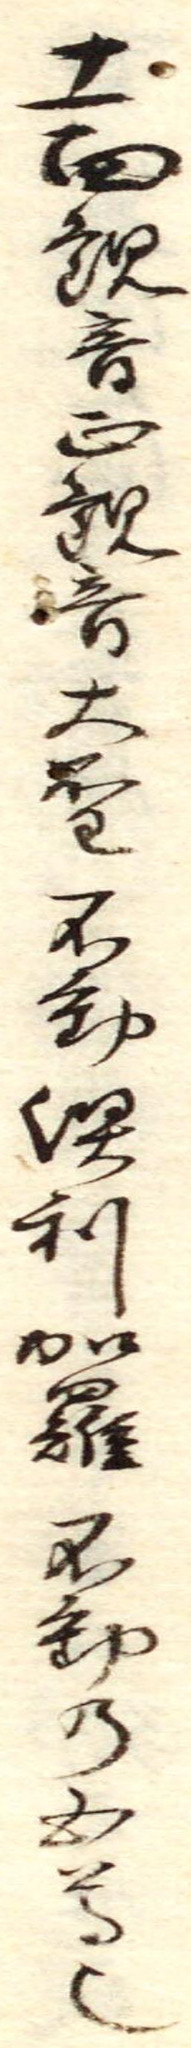十一面観音正観音大聖不動倶利伽羅不動の五尊也
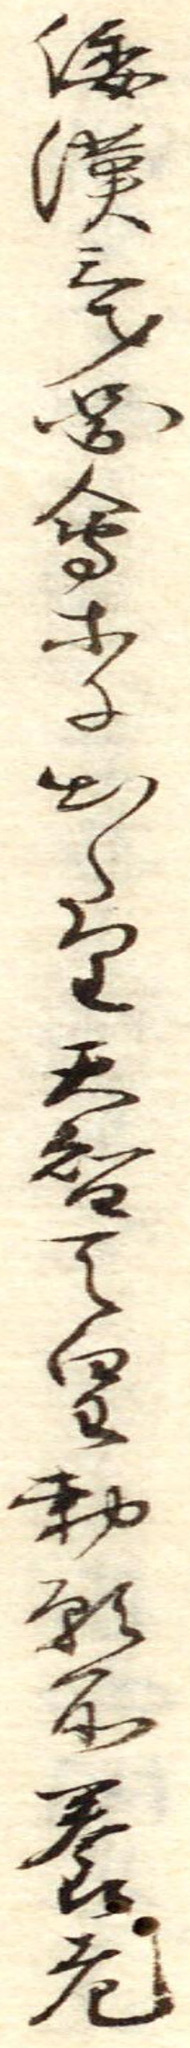倭漢三才図会等に出たり天智天皇勅願所養老
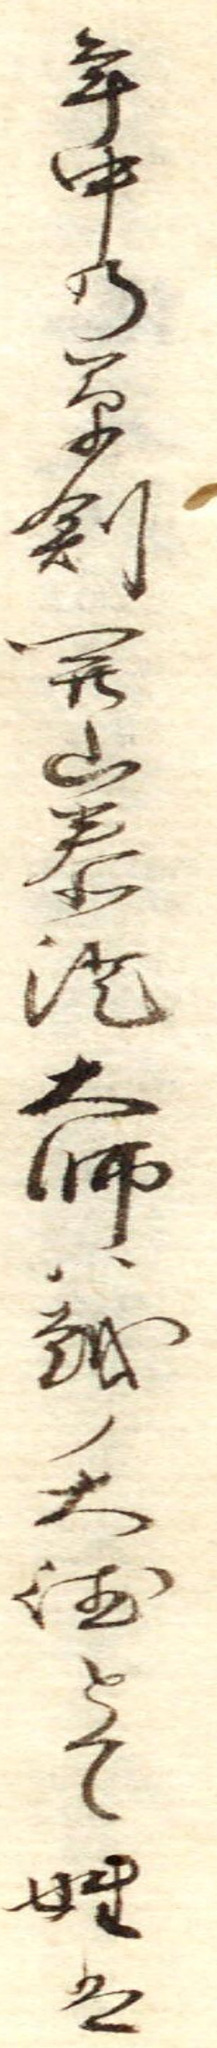年中の草創開山泰澄大師は越ノ大徳とて姓は
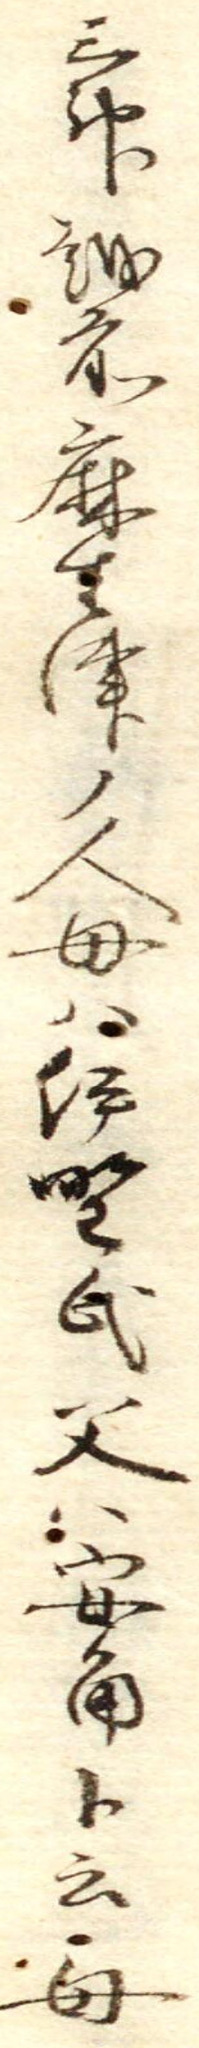三神越前麻生津ノ人母は伊野氏父は安角と云母
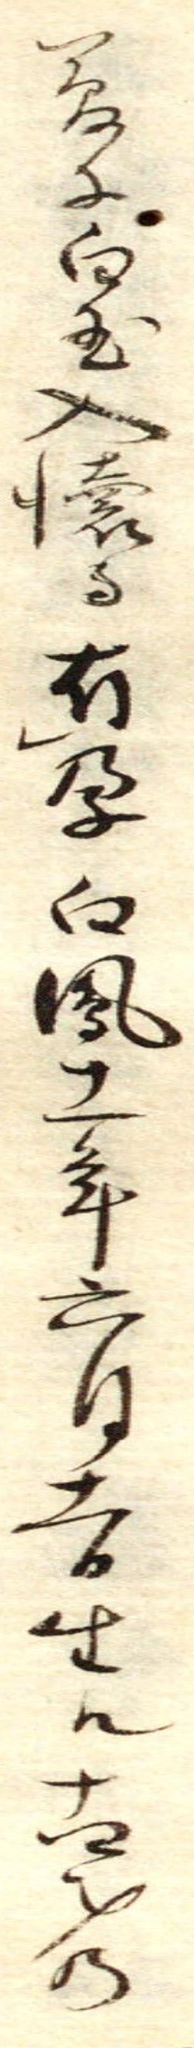夢に白玉入懐る有孕白鳳十一年六月十一日生る十四才の

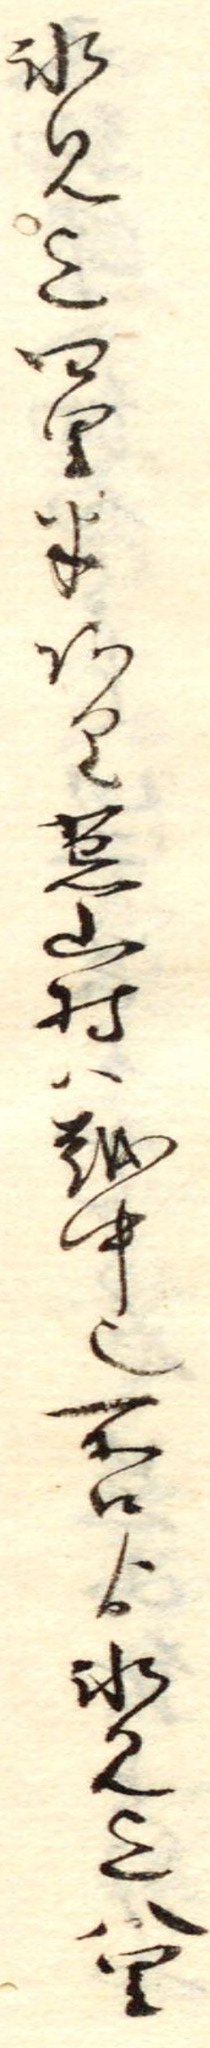氷見迄四里半あり荒山村は越中也所口ゟ氷見迄八里
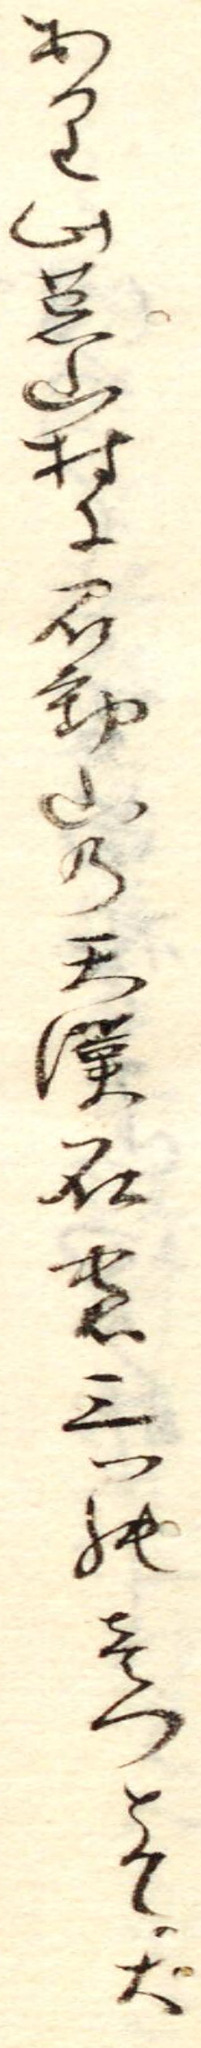あり此荒山村に石動山の天漢石の三ッの壱つとて大
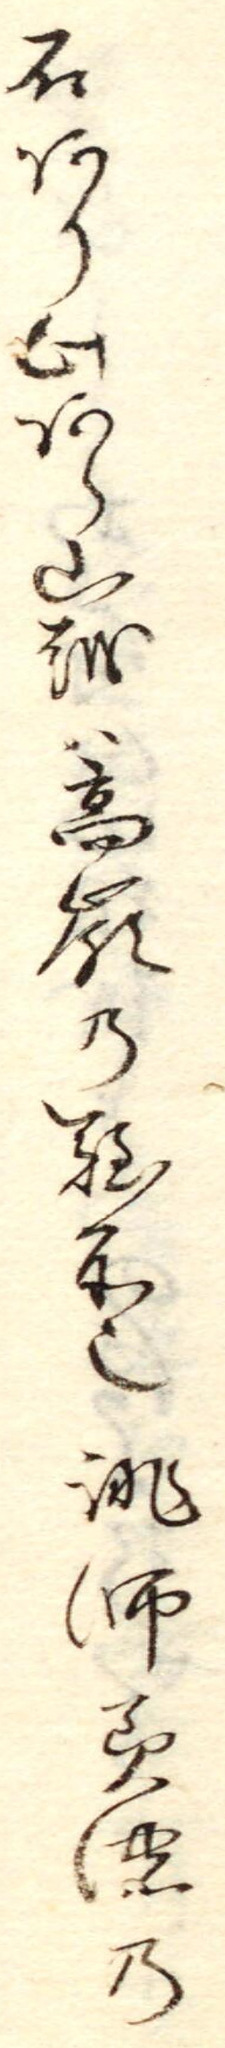石あり此あら山越は高嶺の難所也誂師美濃の
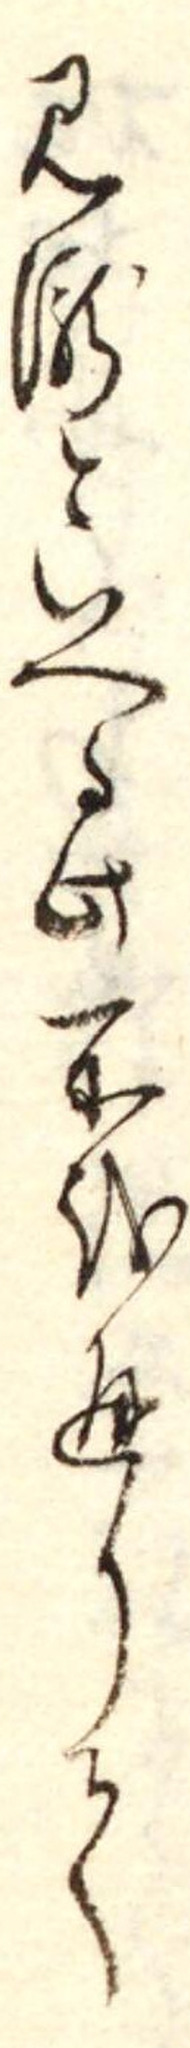見瀧といへる此所を通りて
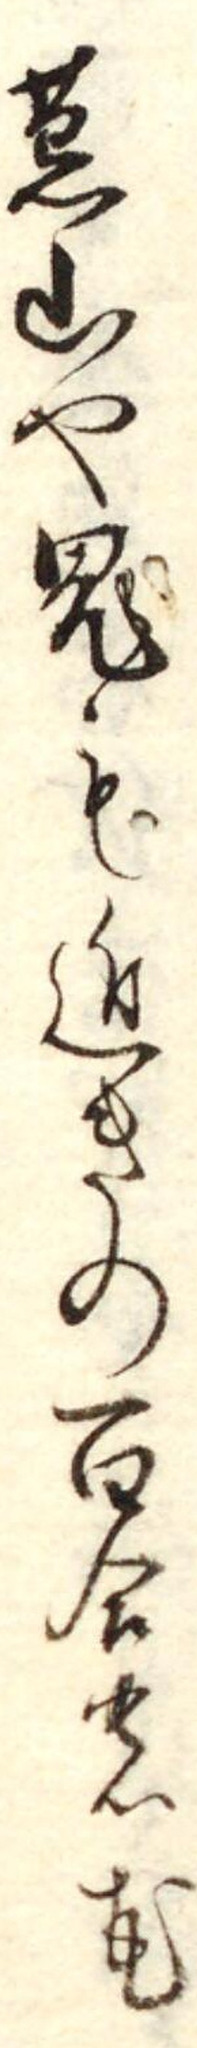荒山や鬼も近きの百合の花
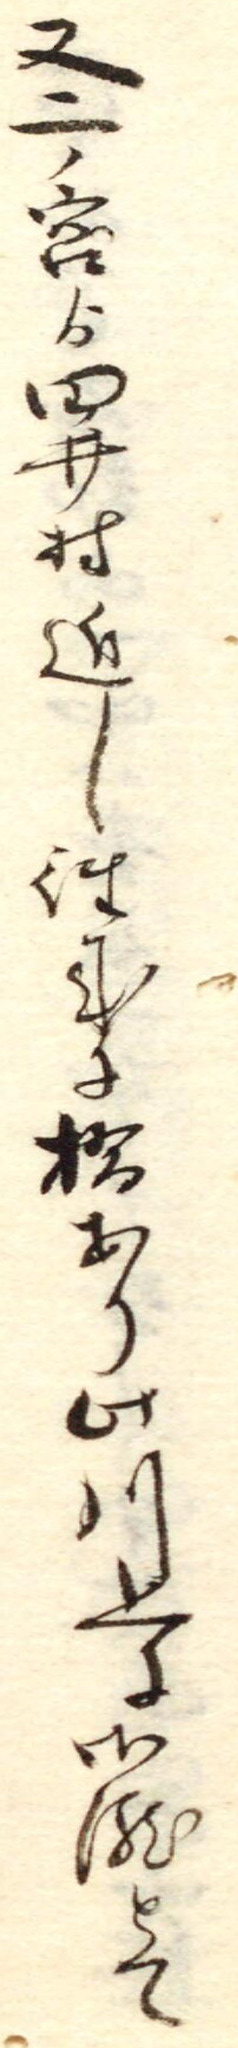又二ノ宮ゟ田井村近し往来に橋あり此川上に御瀧とて
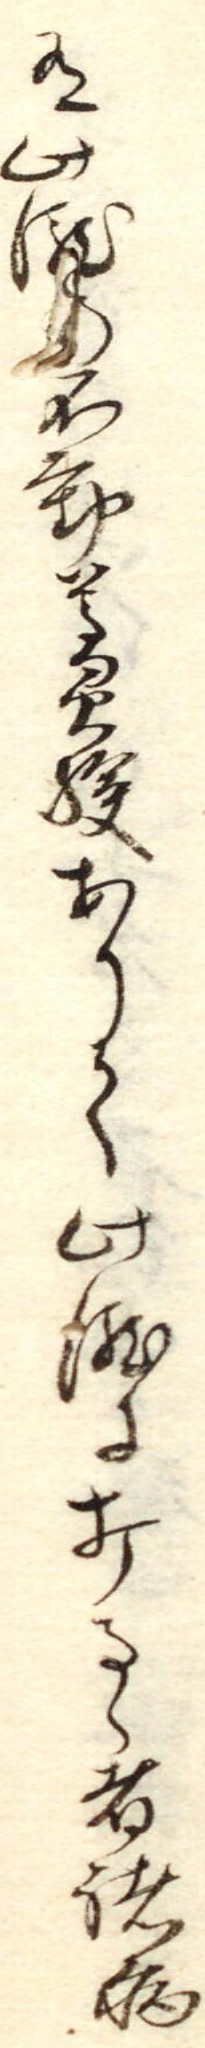有此瀧之不動尊霊験ありて此瀧に打るゝ者諸病
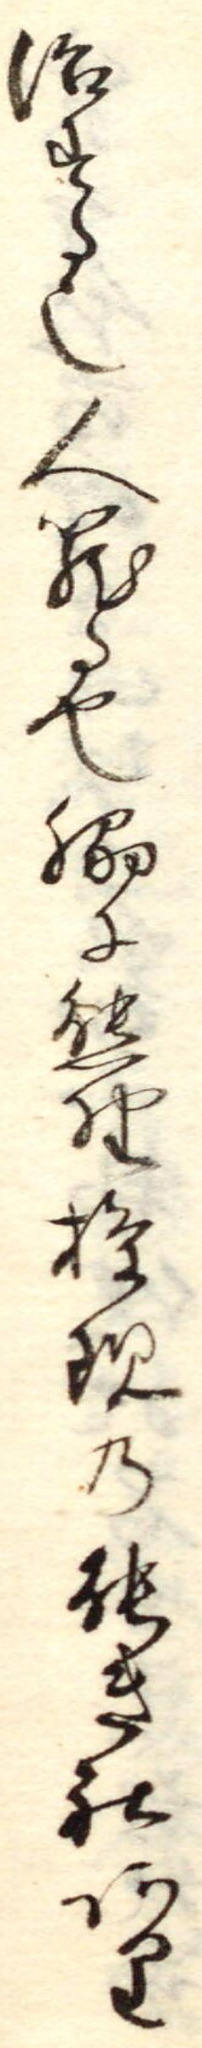治する也人籠る也脇に熊野権現の能き社あり
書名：能登名跡誌
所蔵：Ishikawa Prefectural Library
